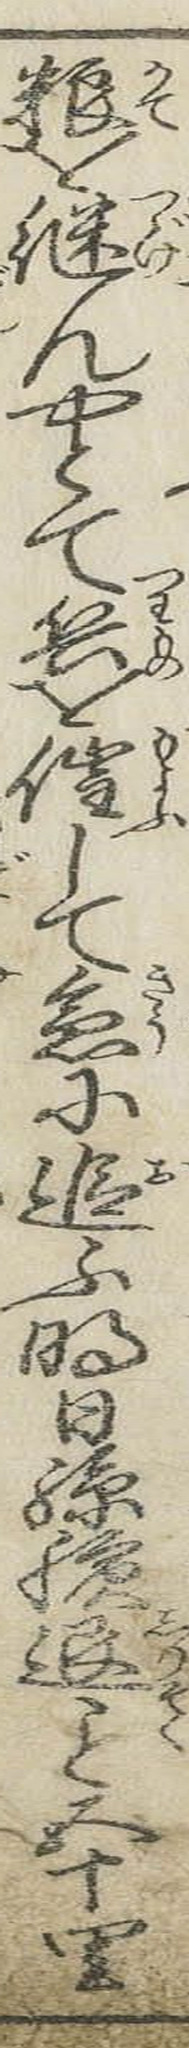粮を継んやとて兵を催して急に追ふ明日孫臏退こと五十里
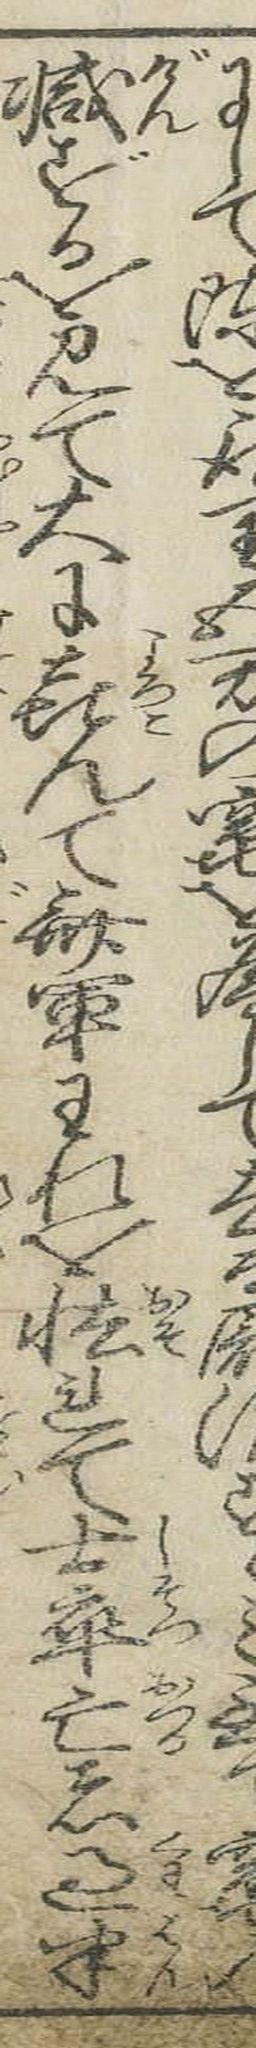減ずるを見て大に喜んて斉軍われを怯れて士卒亡者過半
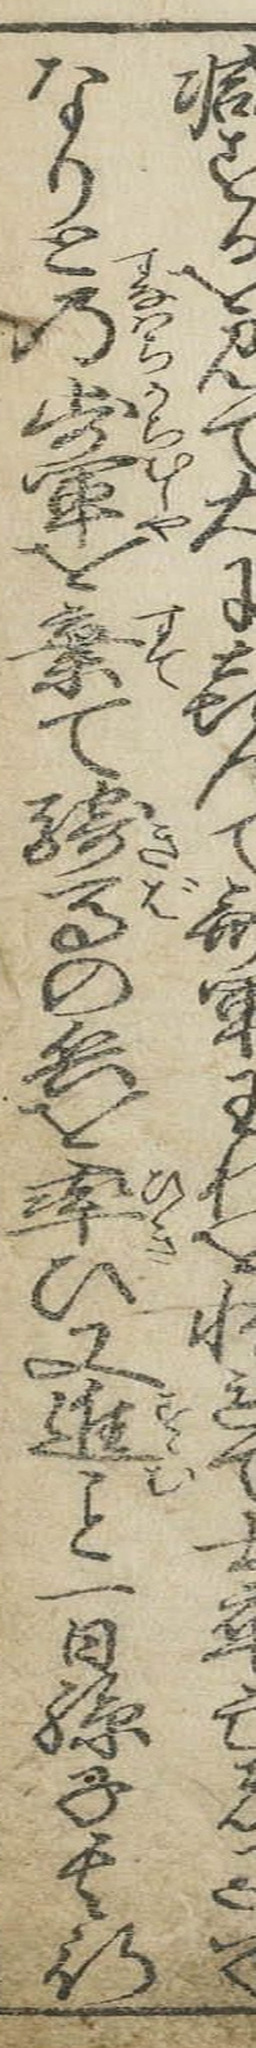なりと乃歩軍を棄て騎馬の兵を率ひ又進こと一日孫子其行

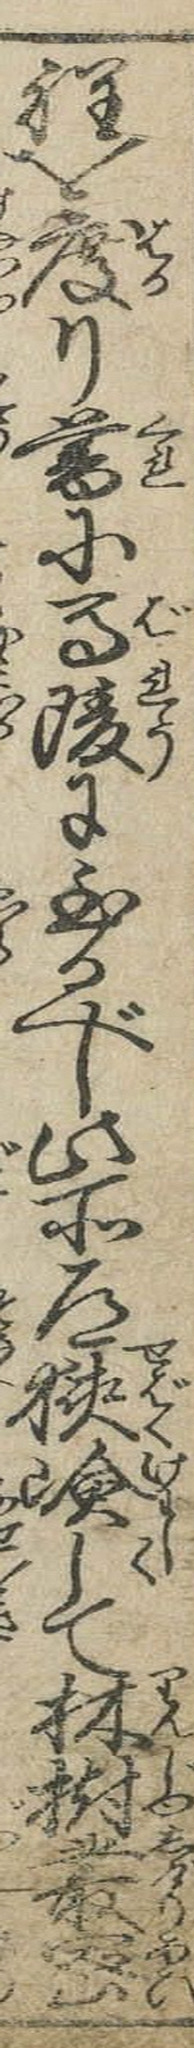程を度り暮に馬陵に至るべし此所道狭嶮して林樹叢密
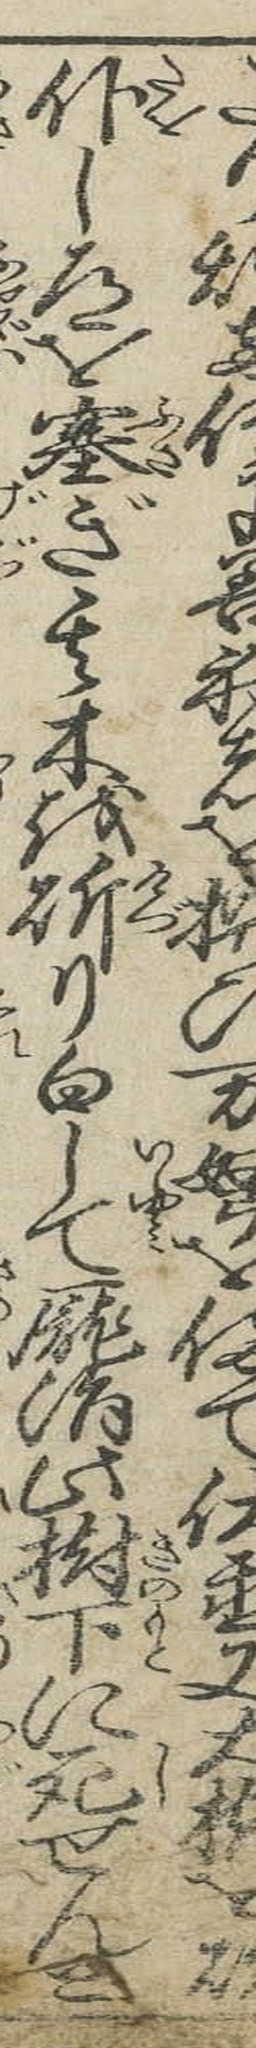仆し道を塞ぎ其木を斫り白して龐涓此樹下に死せんと
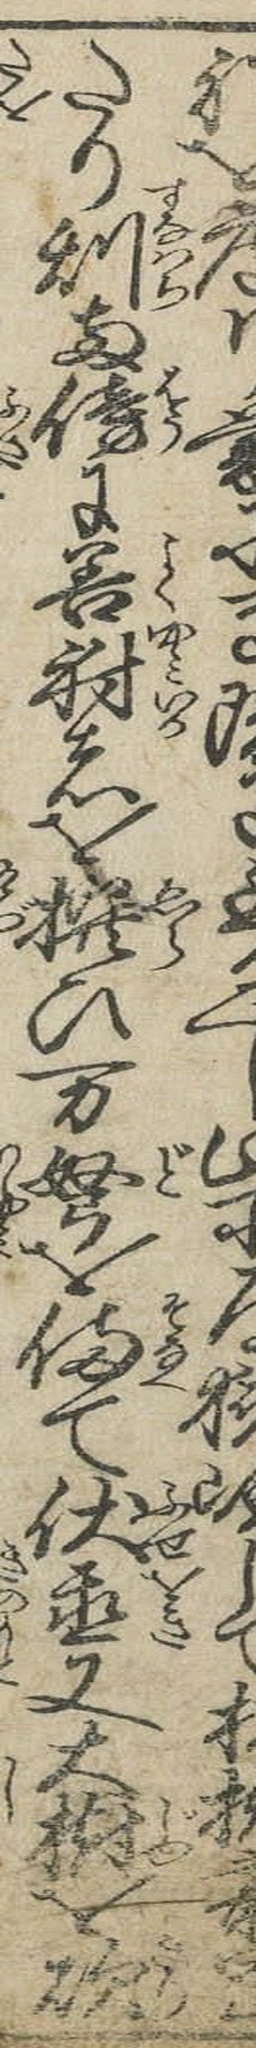たり則両傍に善射者を撰ひ万弩を備て伏置又大樹を砍
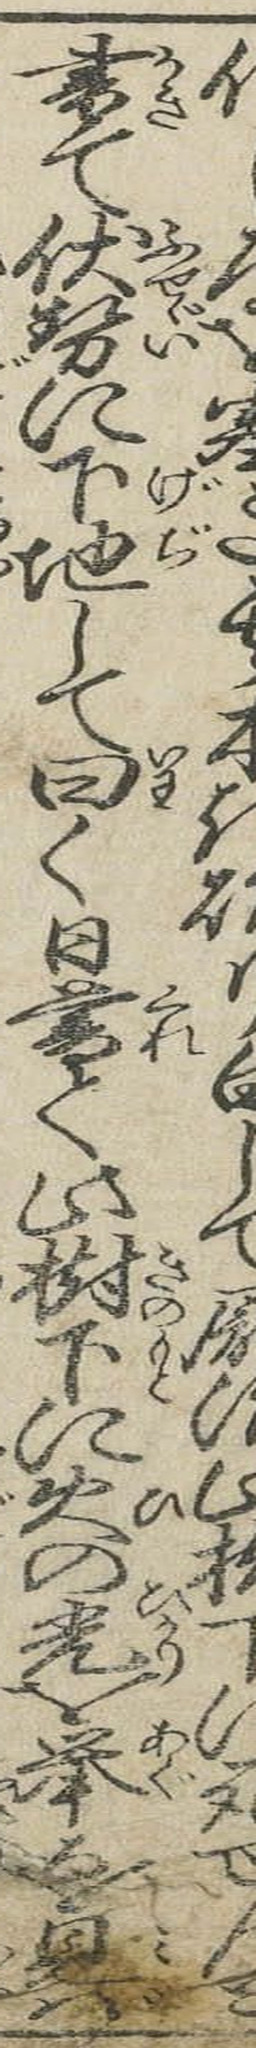書て伏勢に下地して曰く日暮て此樹下に火の光を挙るを見ば
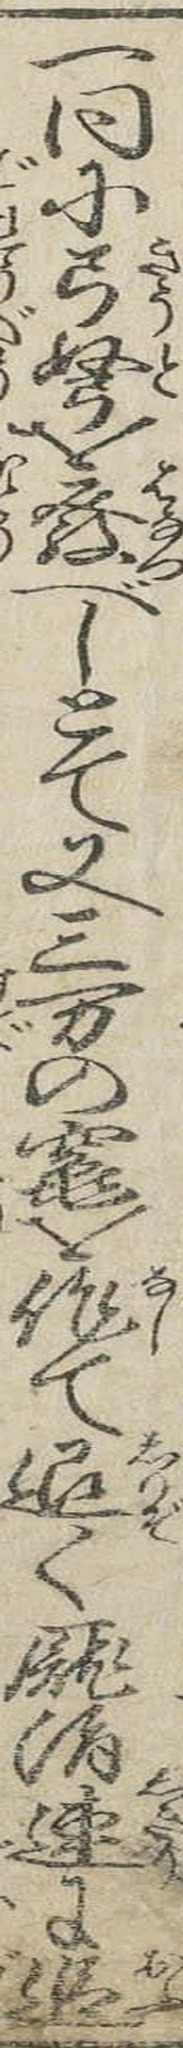一同に弓弩を発べしとて又三万の竈を作て退く龐涓連に追
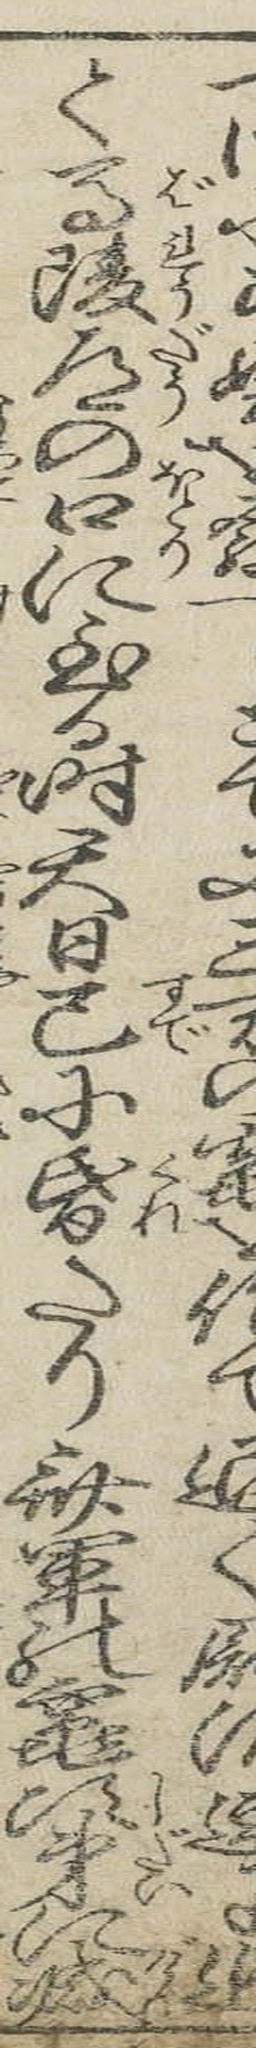て馬陵道の口に至る時天日已に昏たり斉軍の竈次第に減
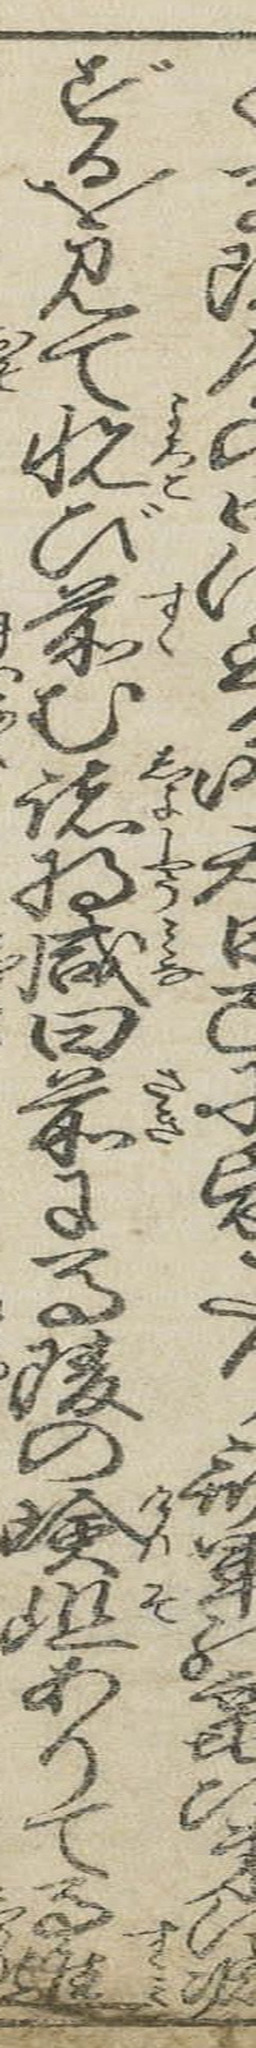ずるを見て悦び前む諸将咸曰前に馬陵の嶮岨ありて馬進
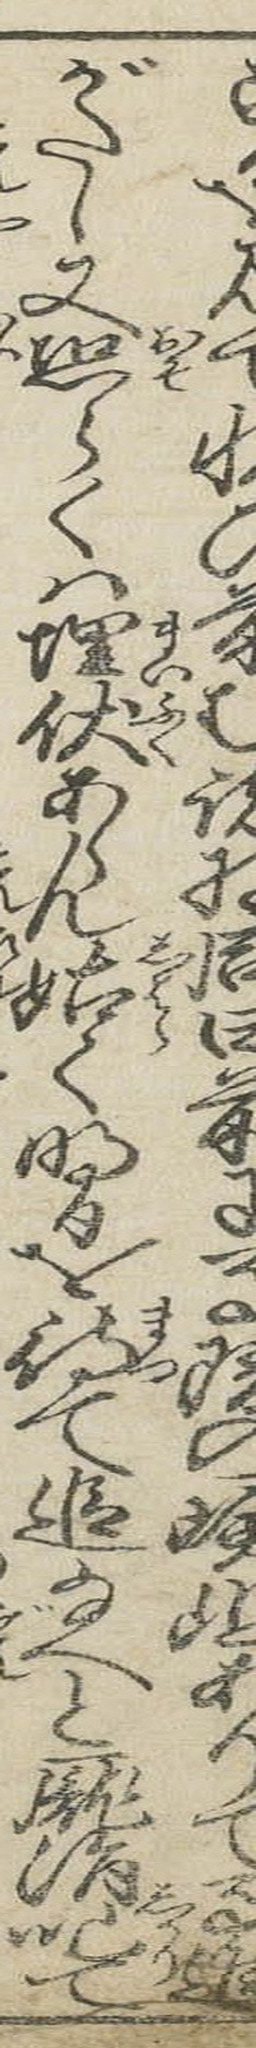がたし又恐らくは埋伏あらん姑く明日を待て追給へと龐涓叱て
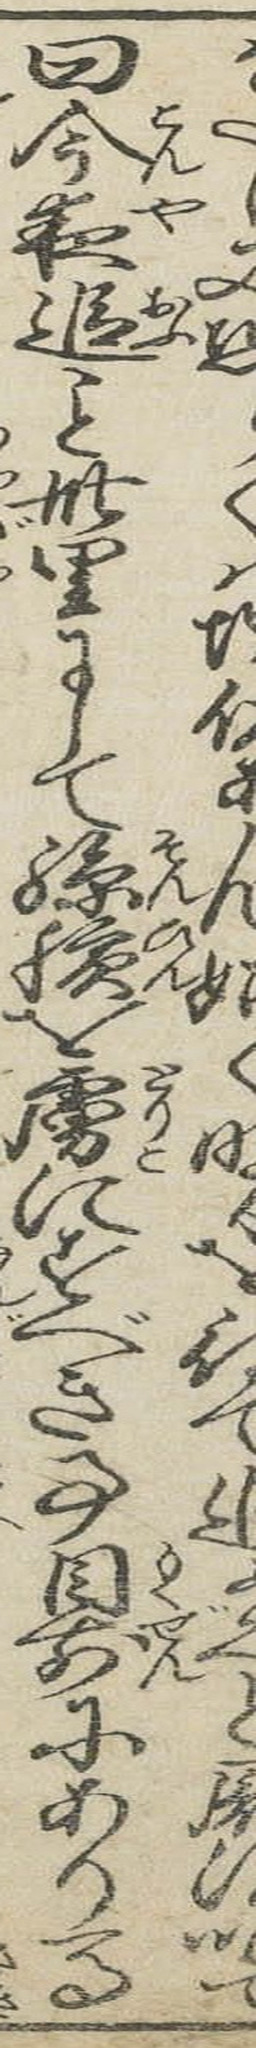曰今夜追こと卅里にして孫臏を虜にすべき事目前にあり馬
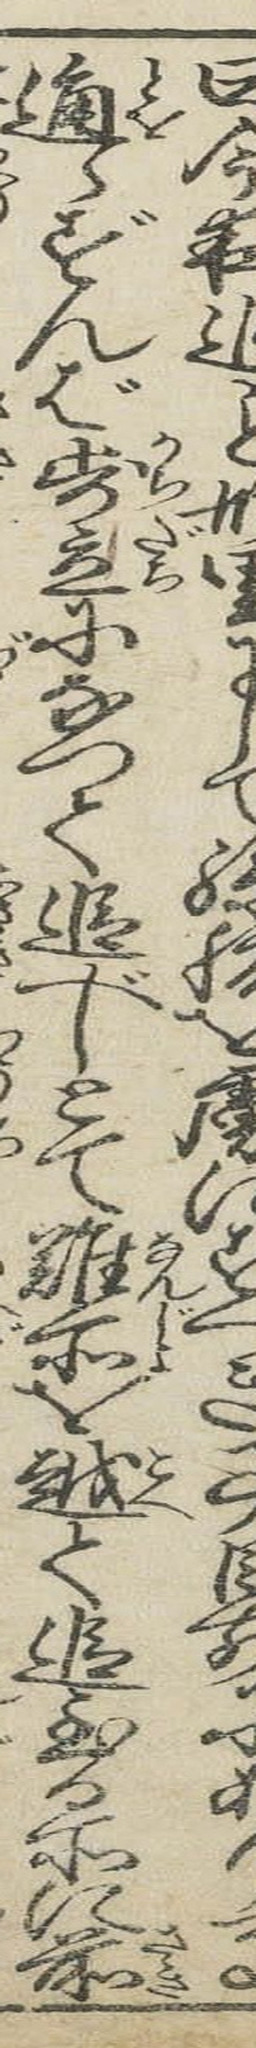通らずんば歩立になつて追べしとて難所を越て追至る所に前
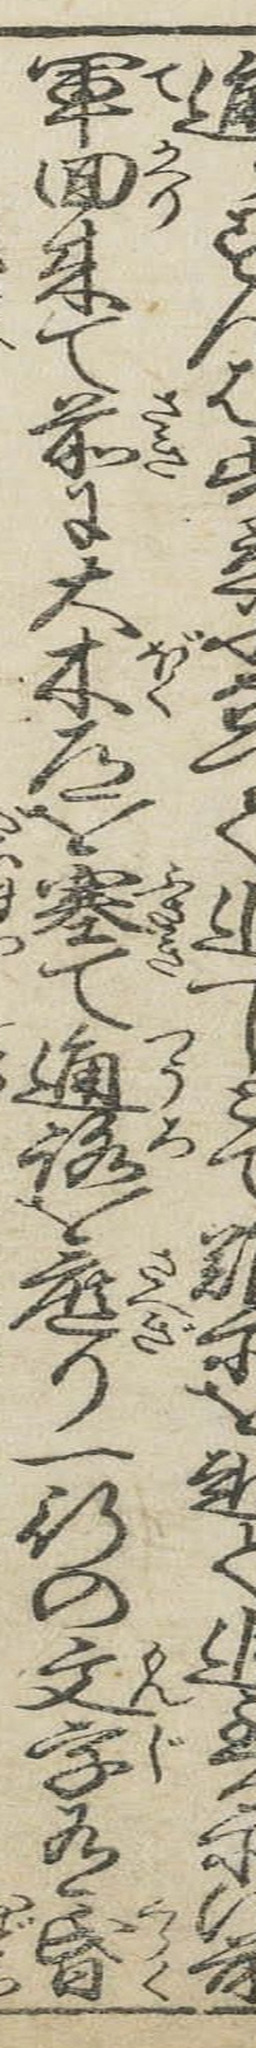軍回来て前に大木道を塞て通路を遮り一行の文字有昏
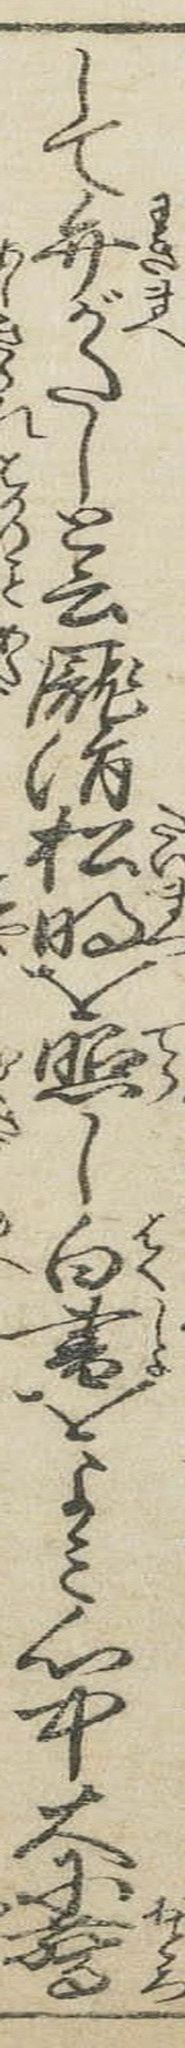して弁がたしと云龐涓松明を照し白書をよみ心中大に驚
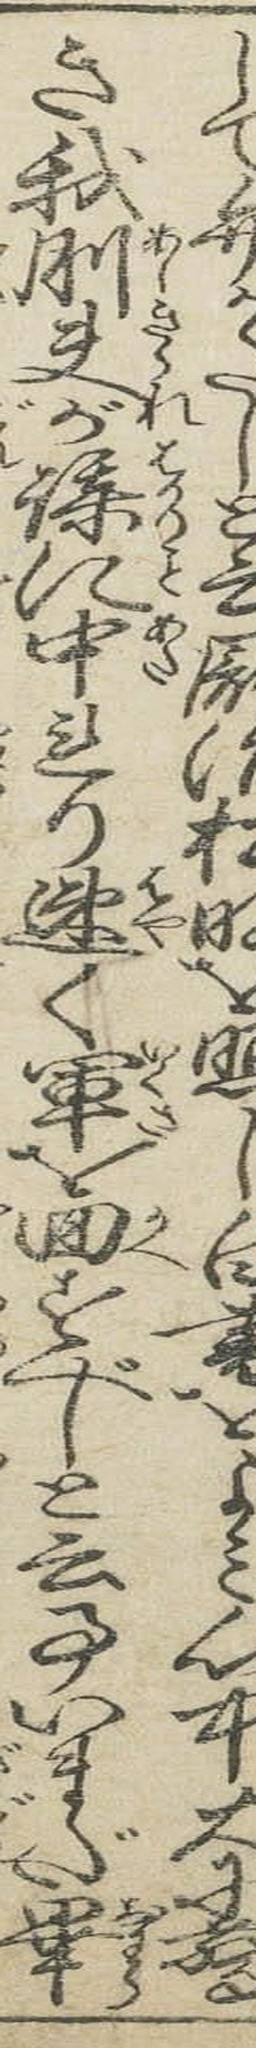き我刖夫が謀に中れり速く軍を回すべしと云事いまだ畢
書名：絵本写宝袋 9巻 6之巻
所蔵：東京学芸大学教育コンテンツアーカイブ
